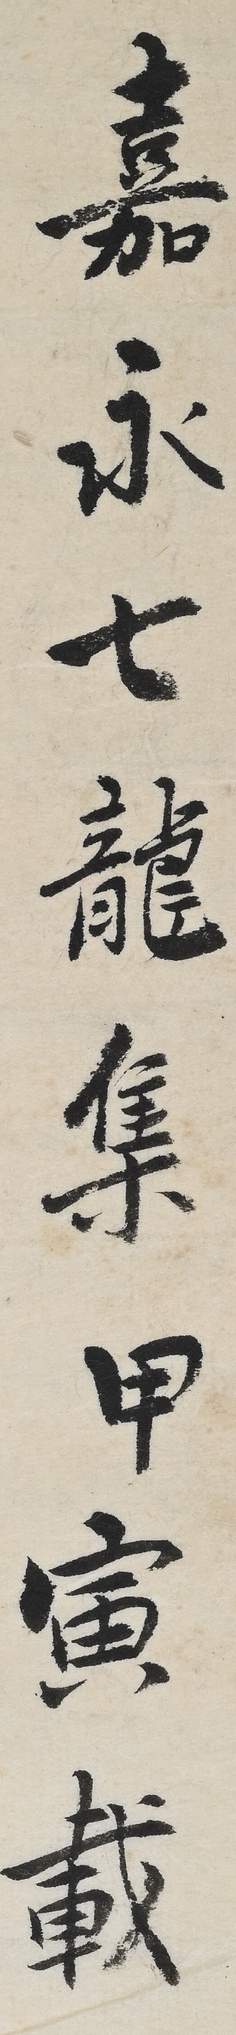嘉永七龍集甲寅載
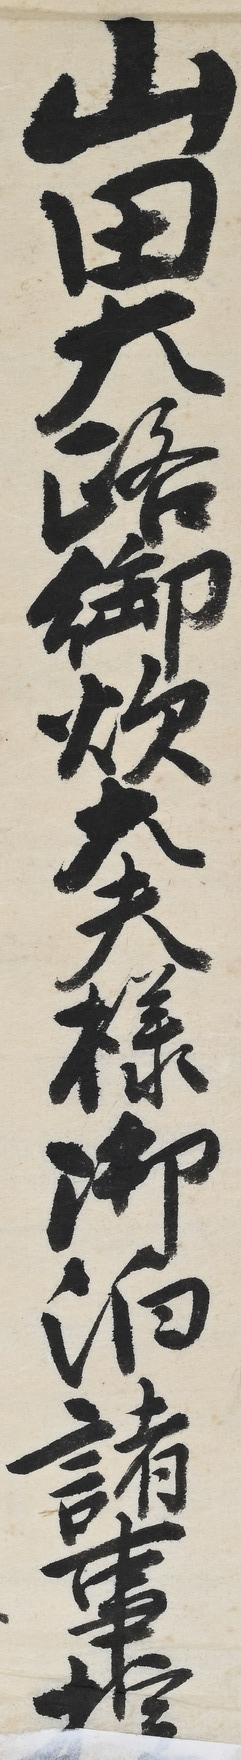山田大路御炊大夫様御泊諸事控

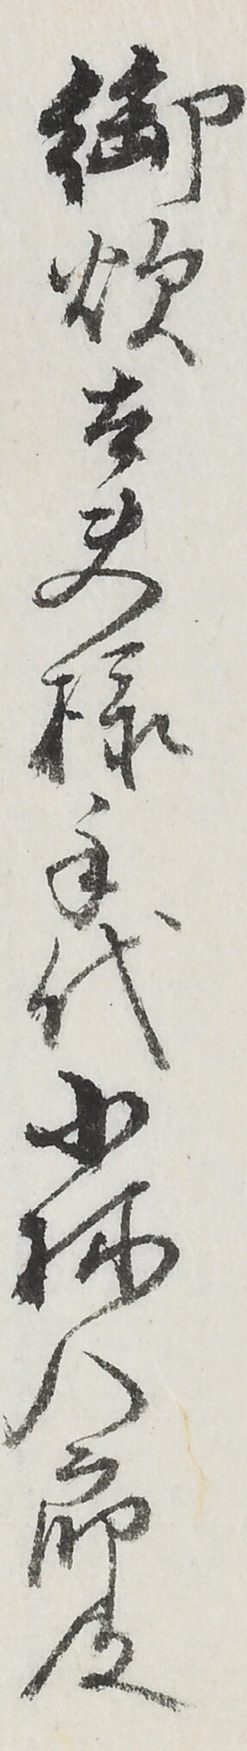御炊太夫様手代小林八郎殿
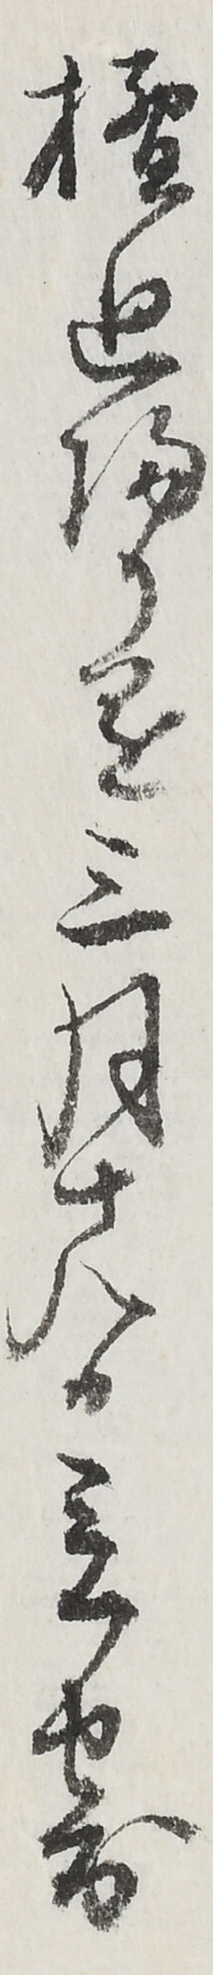檀廻帰リ懸三月十八日立寄
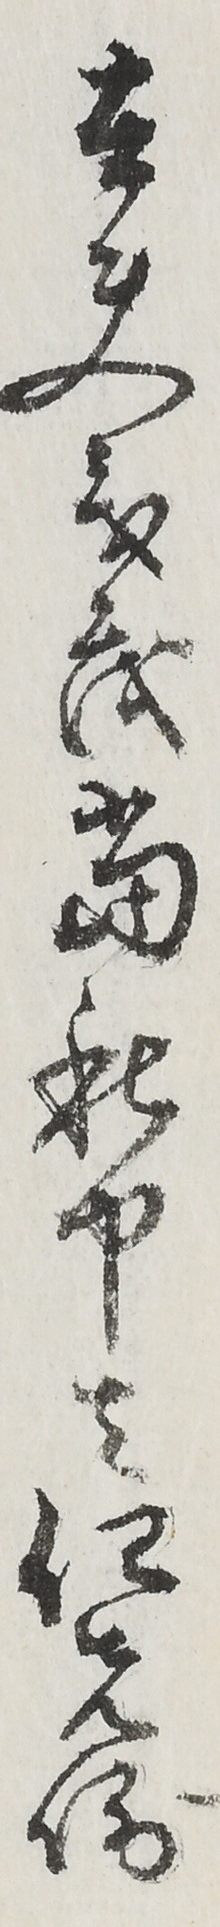太夫義茂当秋中者任先例
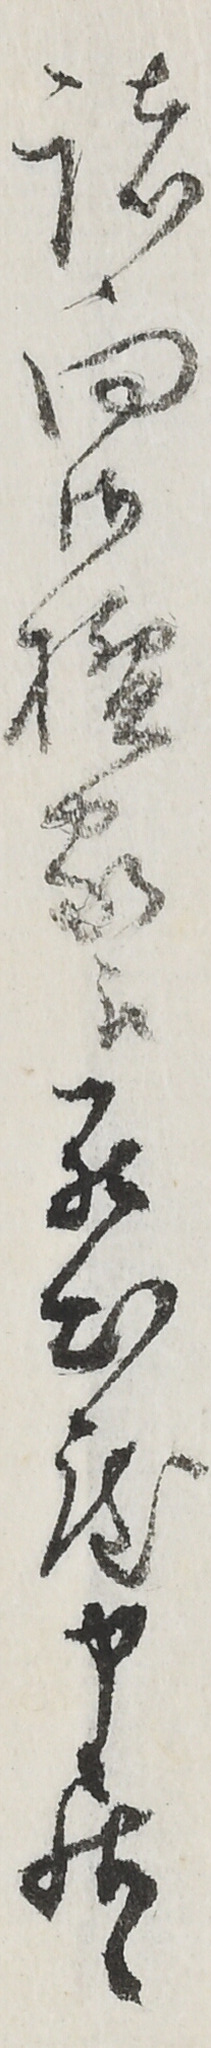諸向御檀家江罷出度申居候
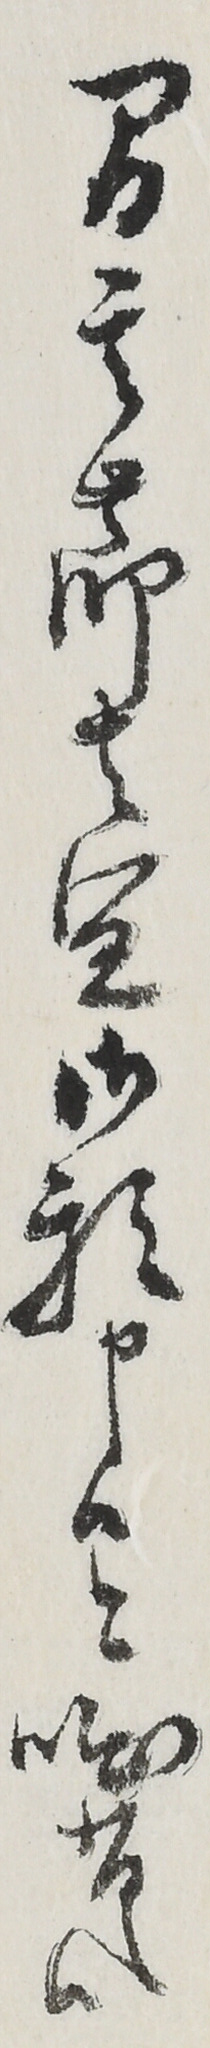間其節者宜御頼申候者咄有候間
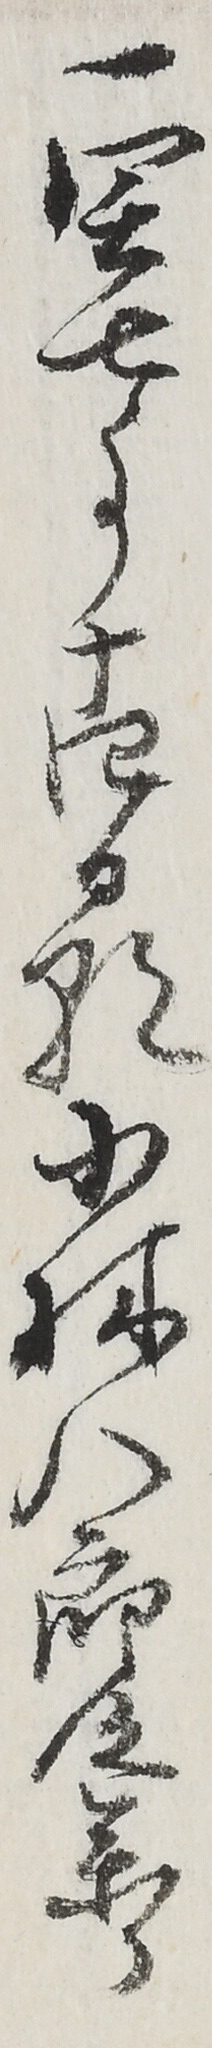一閏七月十四日願小林八郎殿参リ
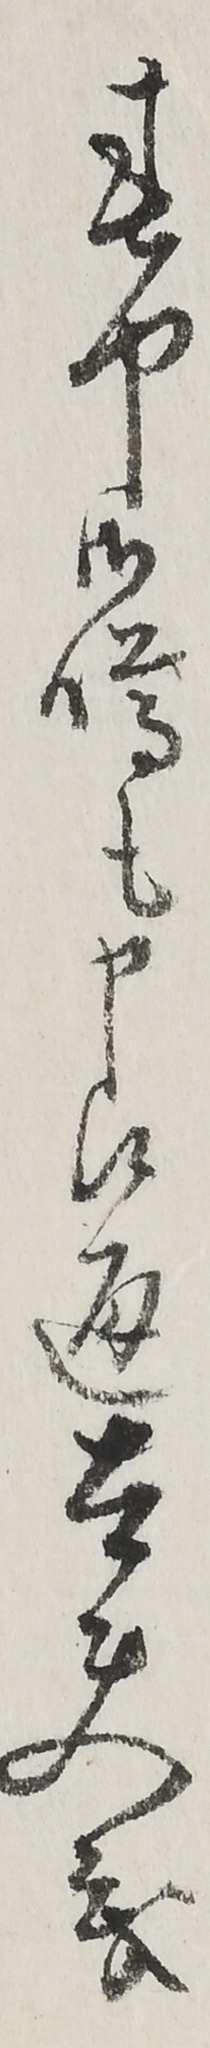春申御噂も申候通太夫義
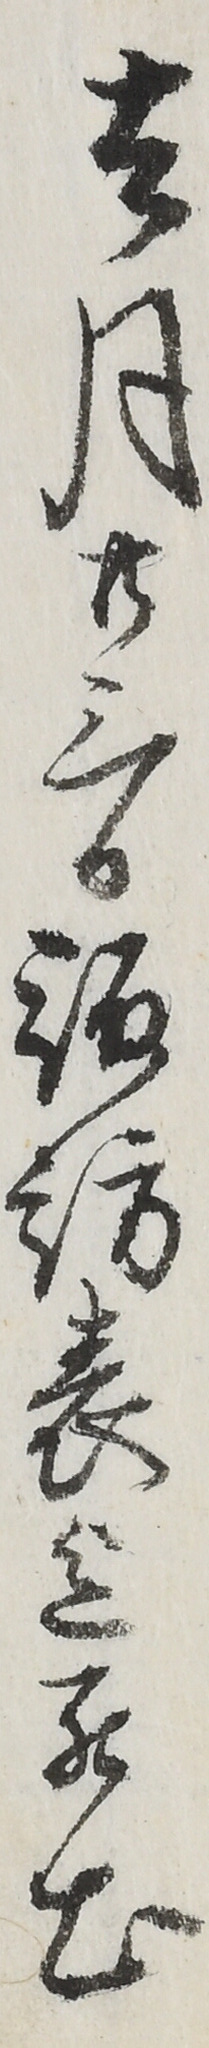去月廿三日諏訪表迄罷出
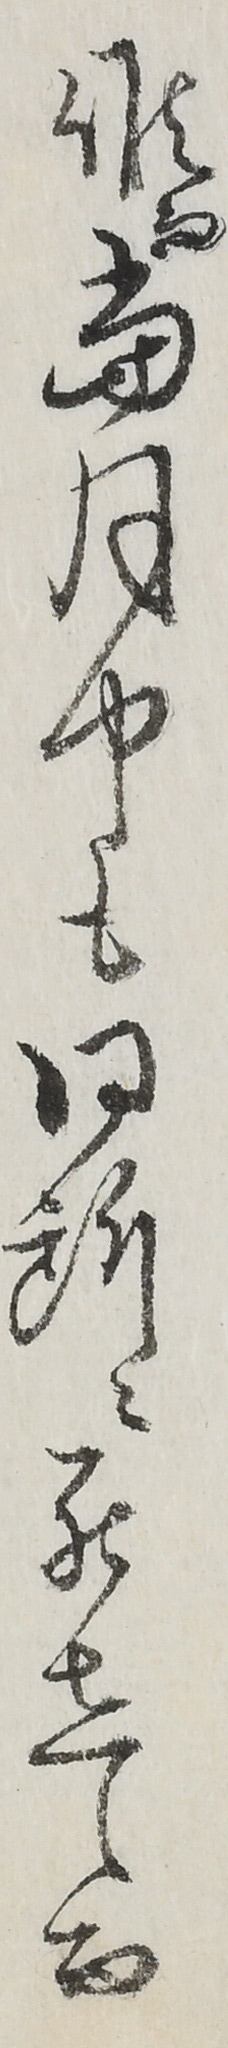候而当月中も同所ニ罷在候而
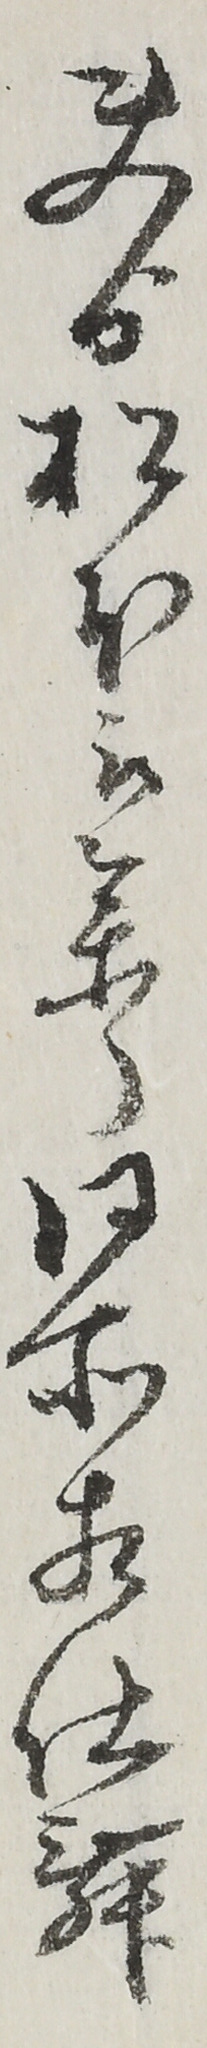夫ゟ松本被参リ同所相仕舞
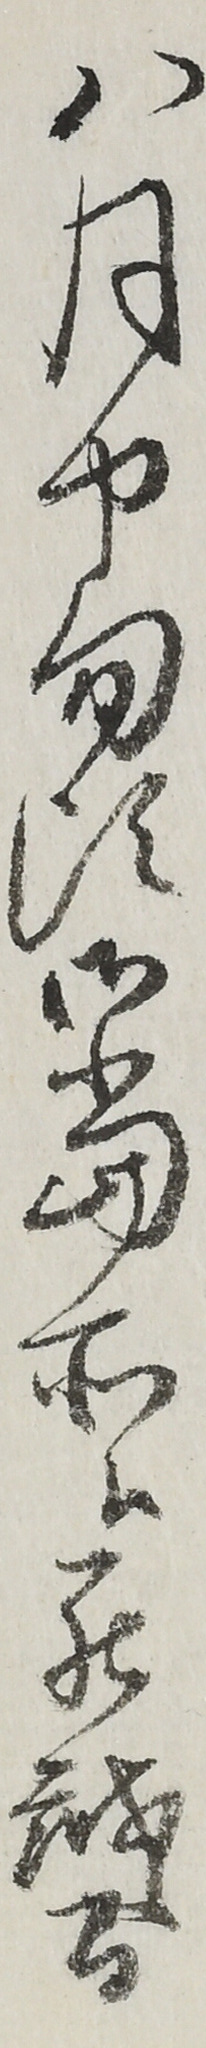八月中旬頃御当所江罷越候間
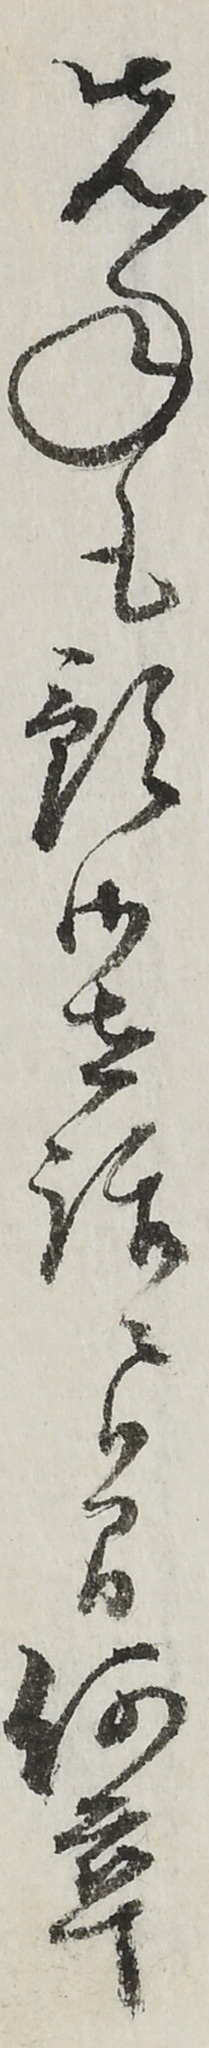先年も願御世話ニ候間何卒
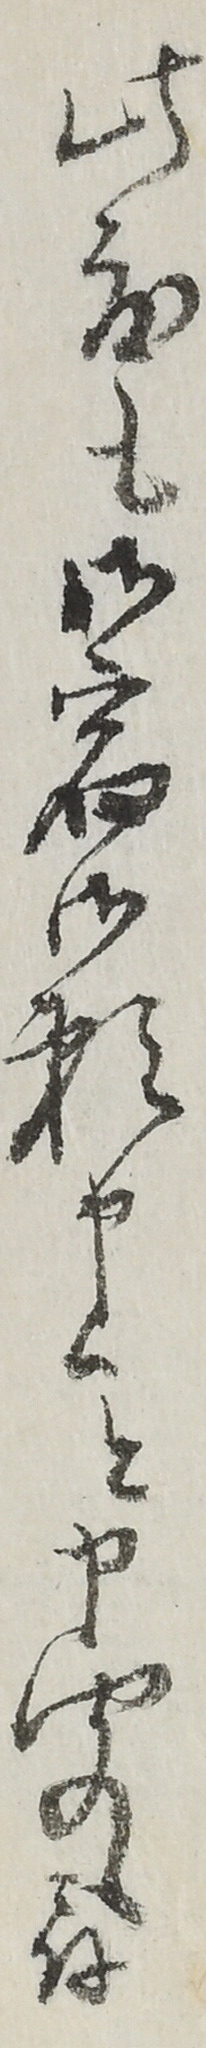此度も御宿御頼申候と申聞候ニ付
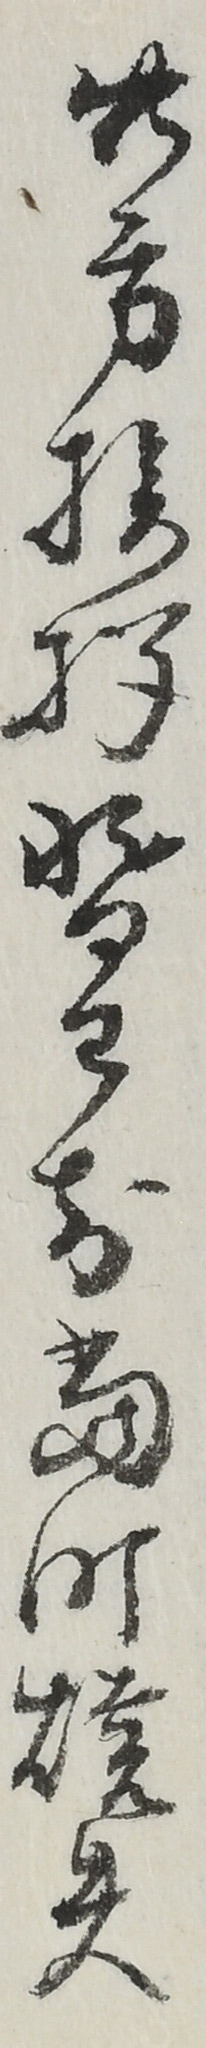此方挨拶暫已前当町焼失
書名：山田大路御炊太夫様御泊諸事控
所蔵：伊那市立高遠町図書館・合同会社AMANE
